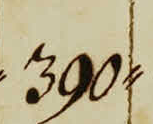390
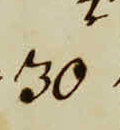30
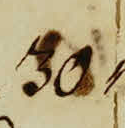30
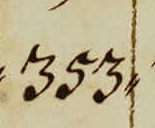353
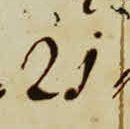21
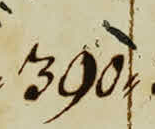390
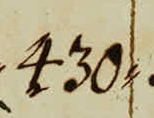430
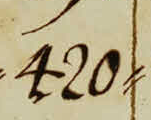420
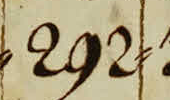292
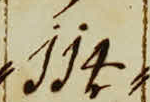114
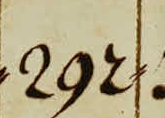292
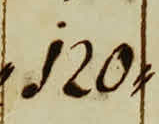120
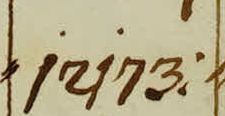12173.
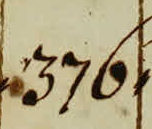376
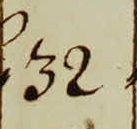32
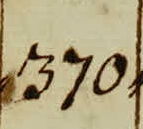370
